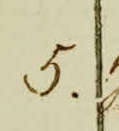5.
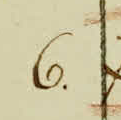6.
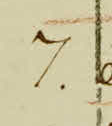7.
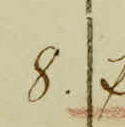8.
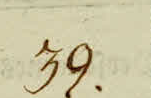39.
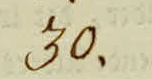30.
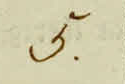5.
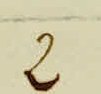2
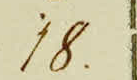18.
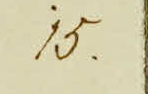15.
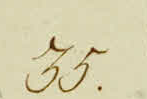35.
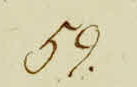59.
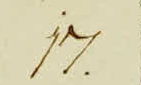17.
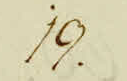19.
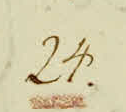24.
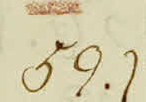59.
